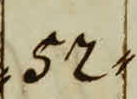52
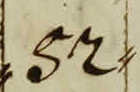52
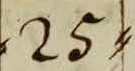25
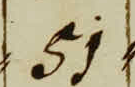51
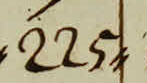225
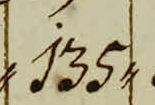135
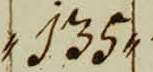135
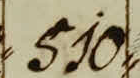510
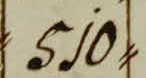510
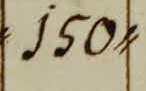150
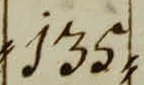135
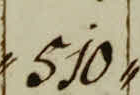510
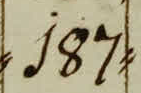187
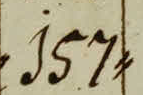157
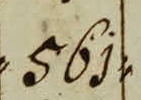561
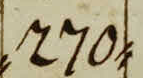270
